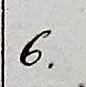6.
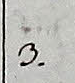3.
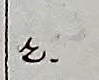2.
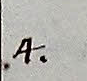4.
